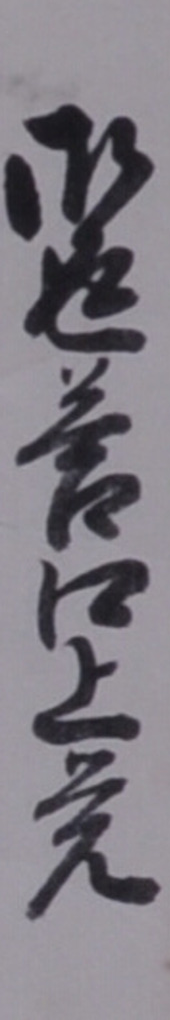御返答口上覚
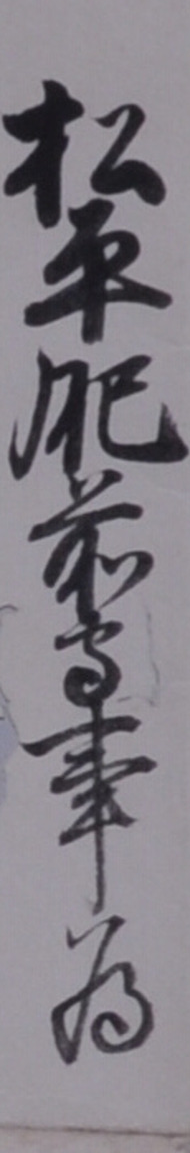松平肥前守事為
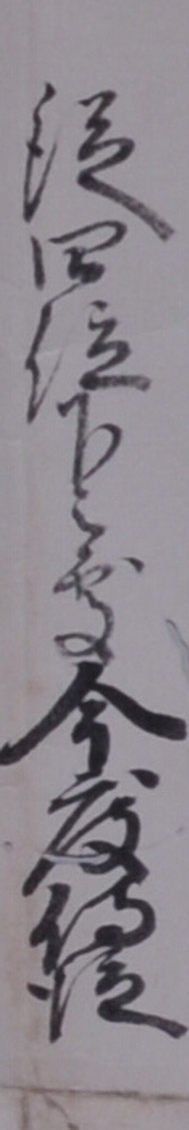従四位下之處今度侍従
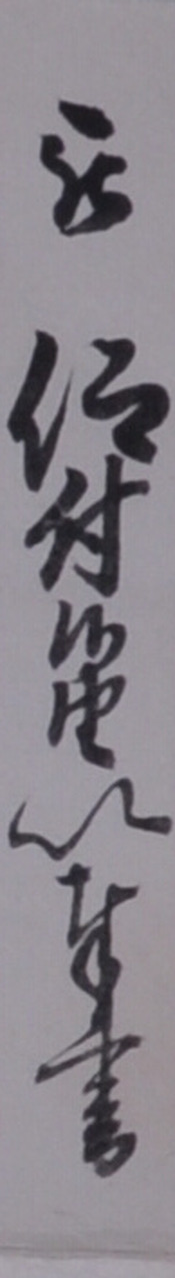被仰付候由以奉書
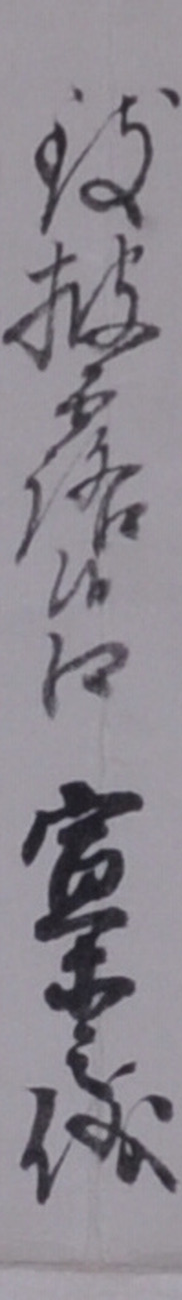致披露候口宣等之儀
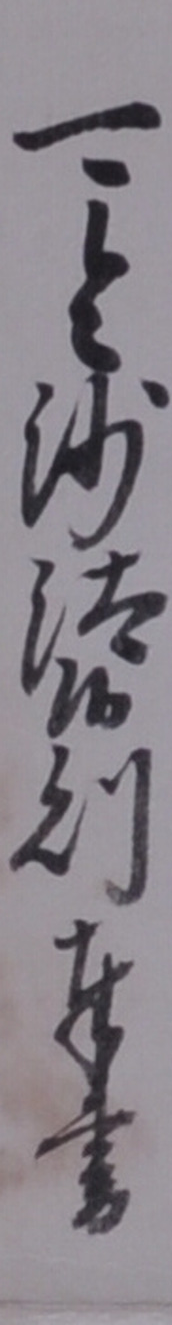可令沙汰候則奉書
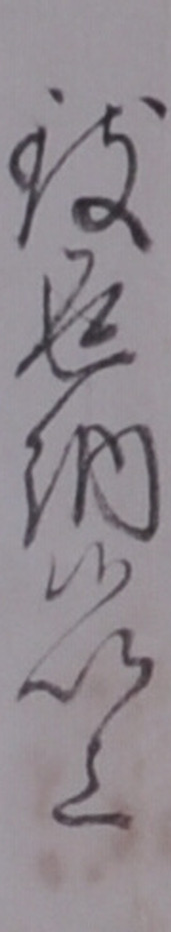致返納候以上
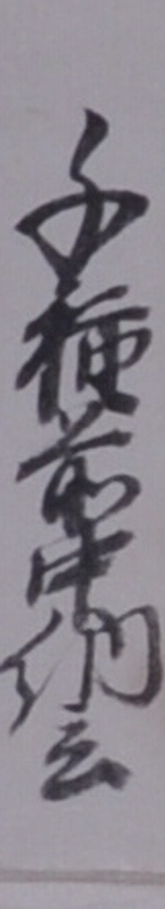千種前中納言
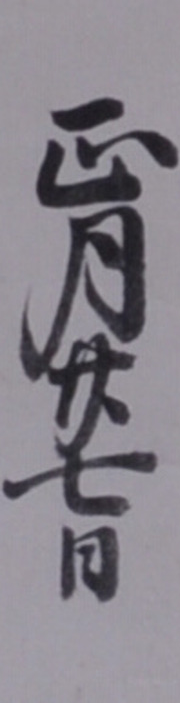正月廿七日
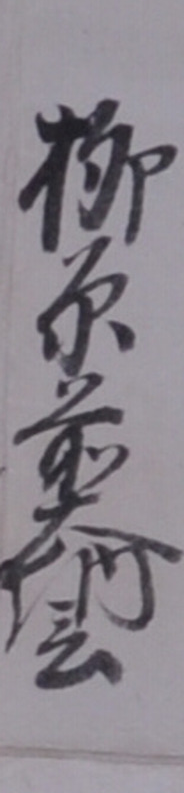柳原前大納言
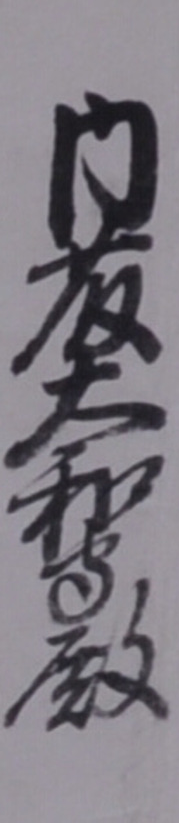内藤大和守殿
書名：御返答口上覚
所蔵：伊那市立高遠町図書館・合同会社AMANE
